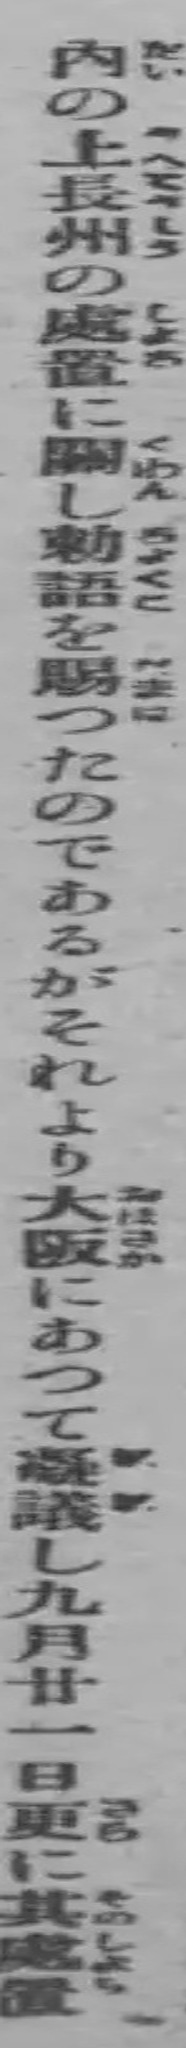内の上長州の処置に関し勅語を賜つたのであるがそれより大阪にあつて凝議し九月廿一日更に其処置
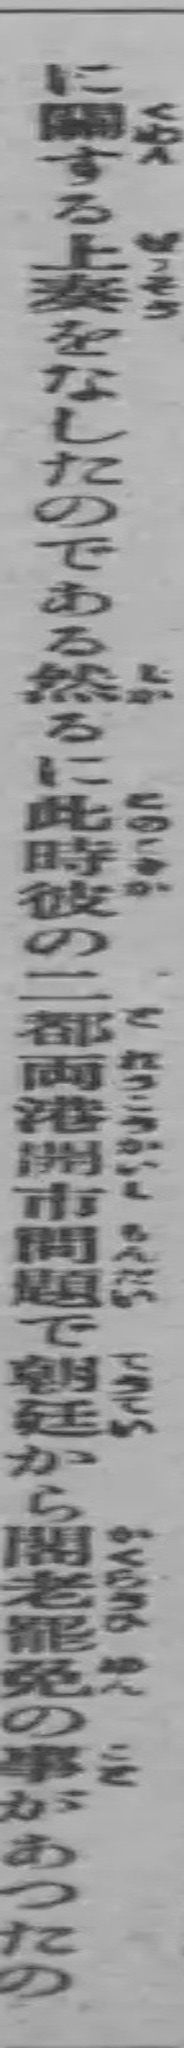に関する上奏をなしたのである然るに此時彼の二都両港開市問題で朝廷から閣老罷免の事があつたの
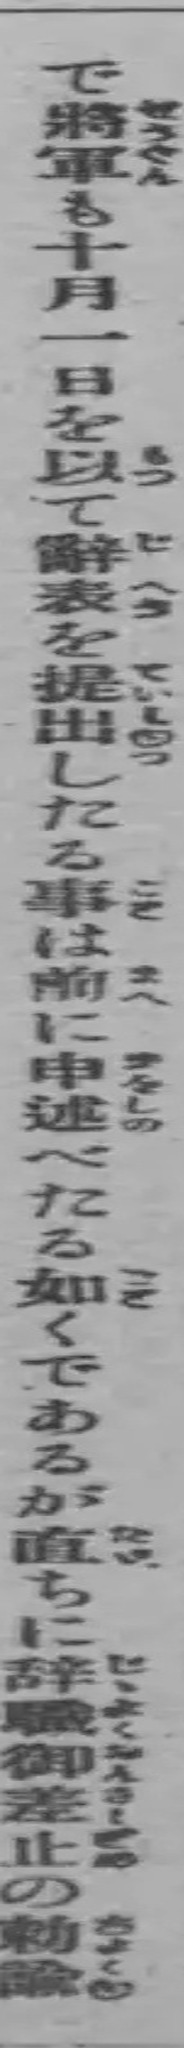で将軍も十月一日を以て辞表を提出したる事は前に申述べたる如くであるが直ちに辞職御差止の勅諭
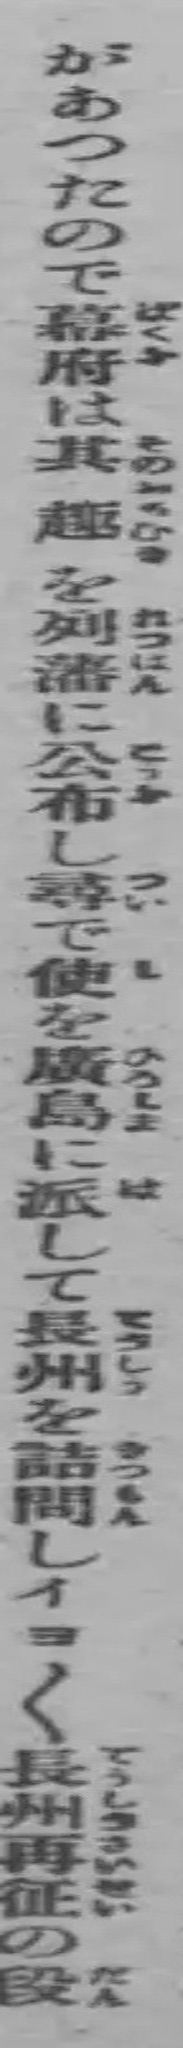があつたので幕府は其趣を列藩に公布し尋で使を広島に派して長州を詰問しイヨ〳〵長州再征の段
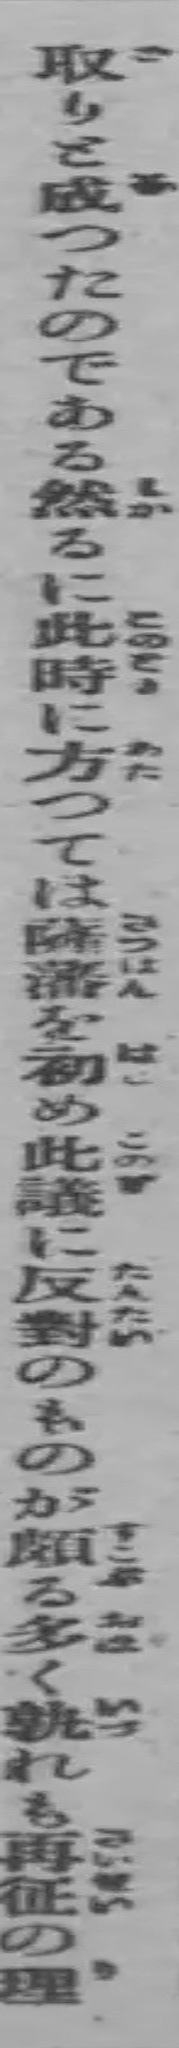取りと成つたのである然るに此時に方つては薩藩を初め此議に反対のものが頗る多く孰れも再征の理
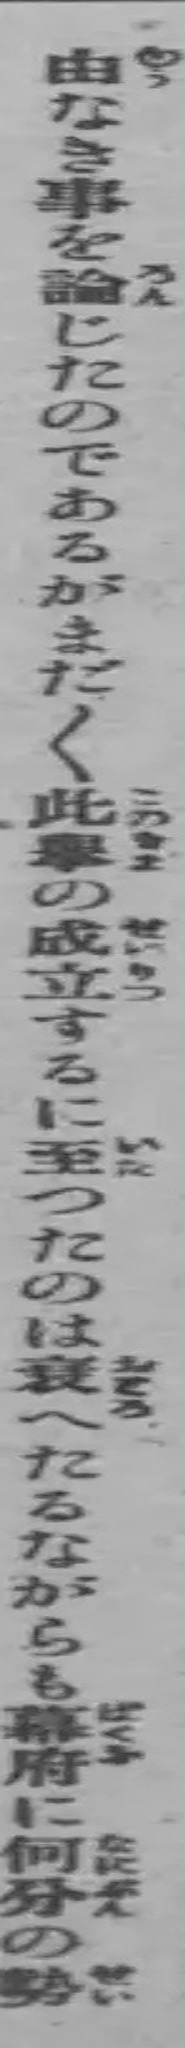由なき事を論じたのであるがまだ〳〵此挙の成立するに至つたのは衰へたるながらも幕府に何分の勢
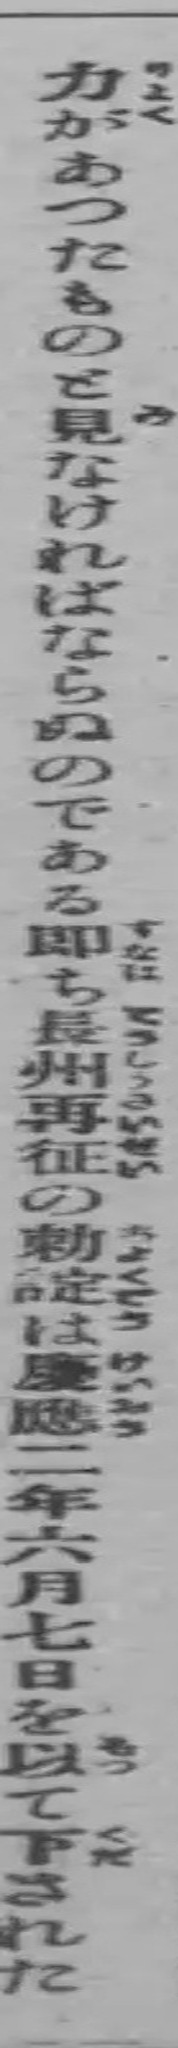力があつたものと見なければならぬのである即ち長州再征の勅諚は慶応二年六月七日を以て下された
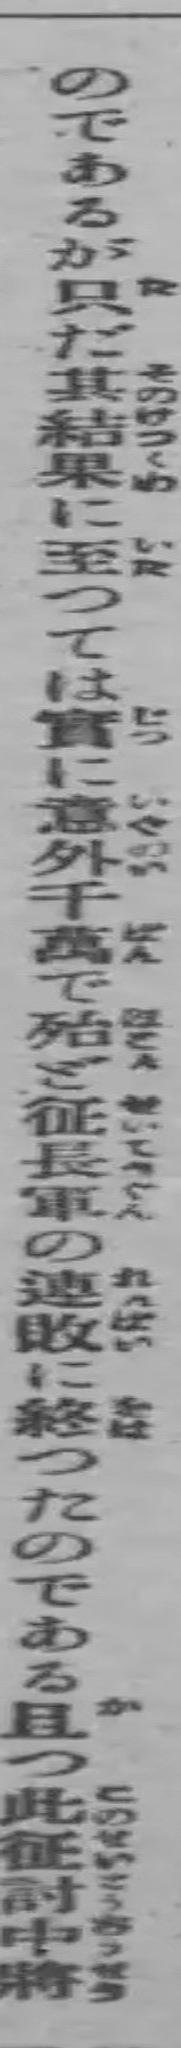のであるが只だ其結果に至つては実に意外千万で殆ど征長軍の連敗に終つたのである且つ此征討中将
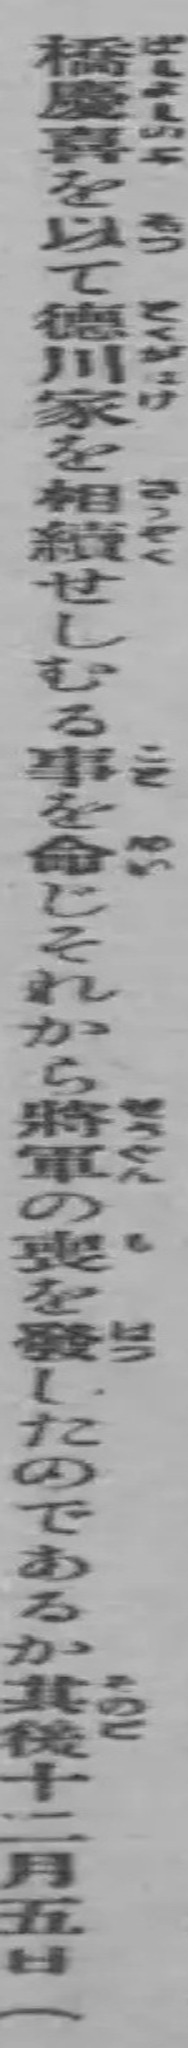橋慶喜を以て徳川家を相続せしむる事を命じそれから将軍の喪を発したのであるか其後十二月五日(
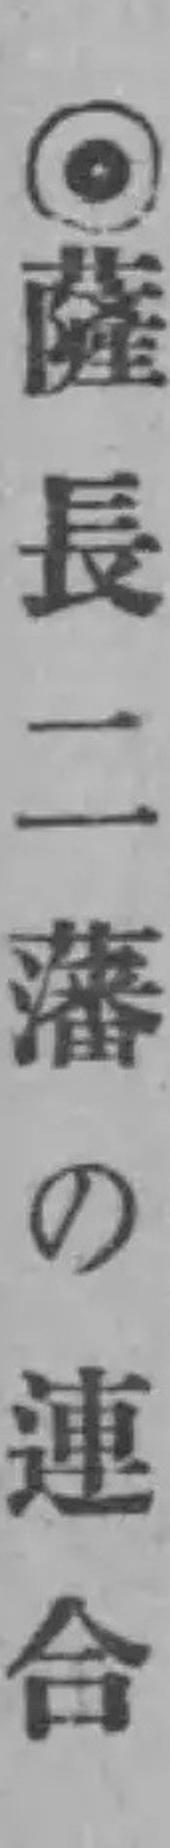⦿薩長二藩の連合
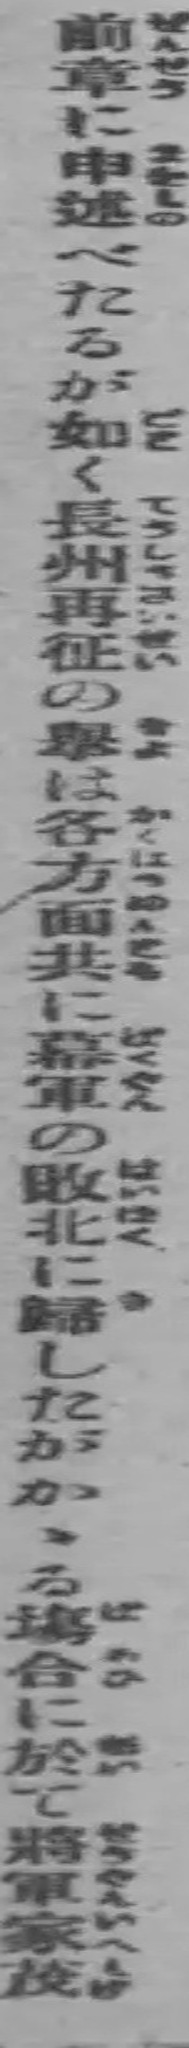前章に申述べたる如く長州再征の挙は各方面共に幕軍の敗北に帰したがかゝる場合において将軍家茂

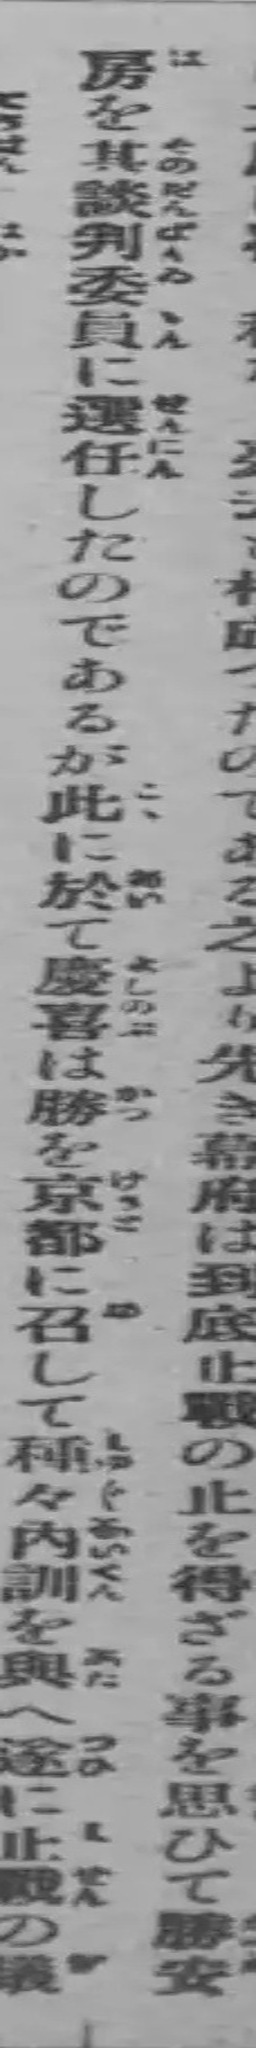房を其談判委員に選任したのであるが此に於て慶喜は勝を京都に召して種々内訓を与へ遂に止戦の議
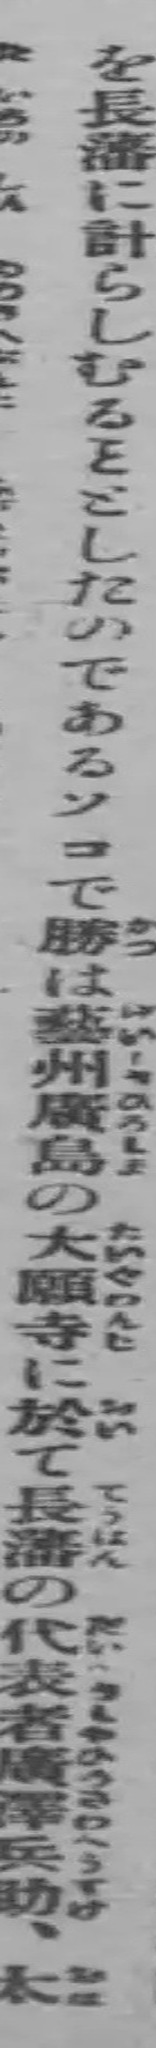を長藩に計らしむることとしたのであるソコで勝は芸州広島の大願寺に於て長藩の代表者廣澤兵助、太
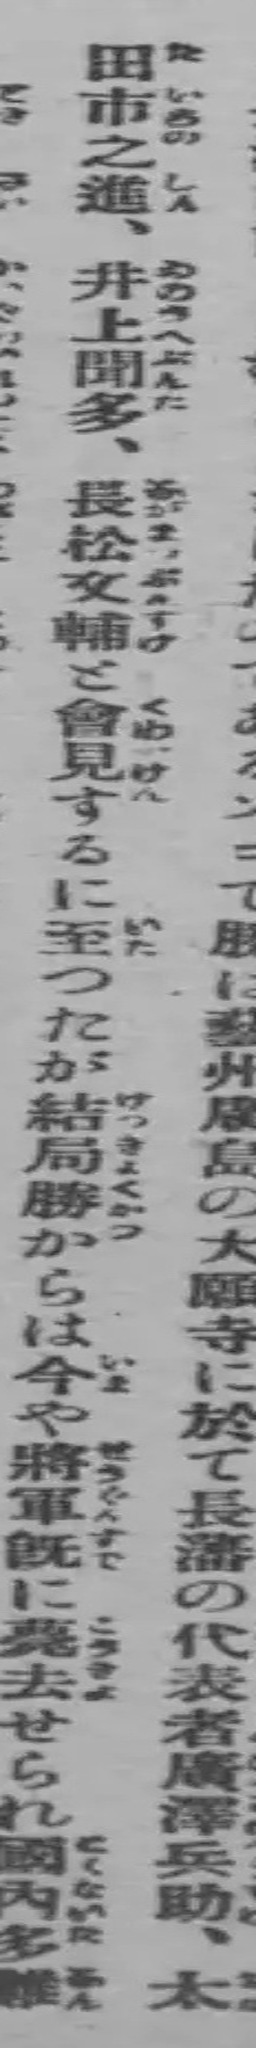田市之進、井上聞多、長松文輔と会見するに至つたが結局勝からは今や将軍既に薨去せられ国内多難
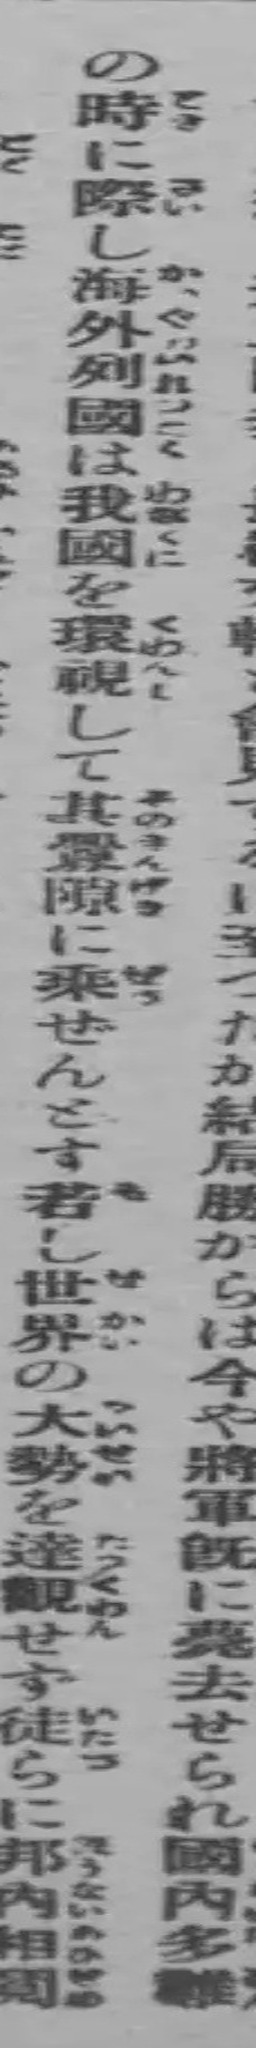の時に際し海外列国は我国環視して其釁隙に乗ぜんとす若し世界の大勢を達観せず徒らに邦内相鬩
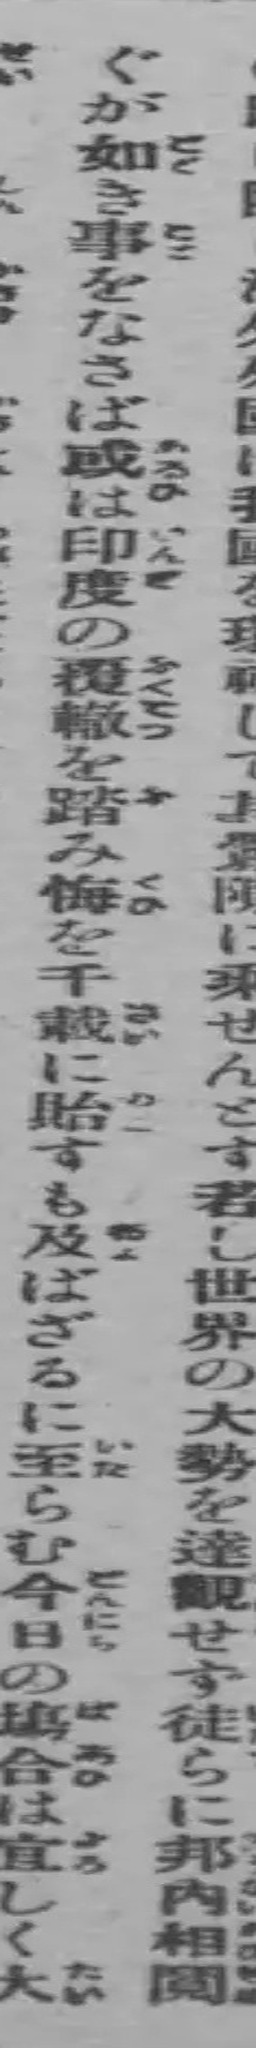ぐが如き事をなさば或は印度の覆轍を踏み悔を千載に貽すも及ばざるに至らむ今日の場合は宜しく大
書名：豊橋市史談
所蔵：国立国会図書館 National Diet Library, JAPAN
